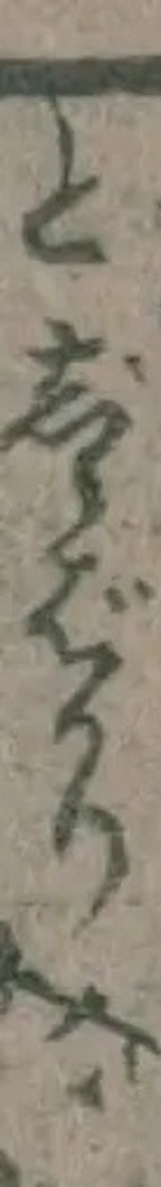としゝばかり
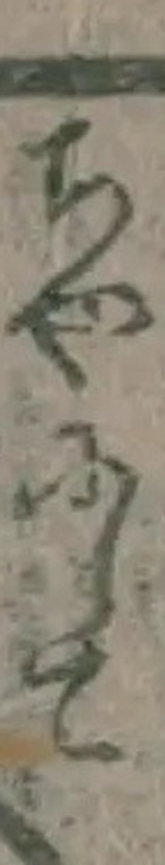ちやにして
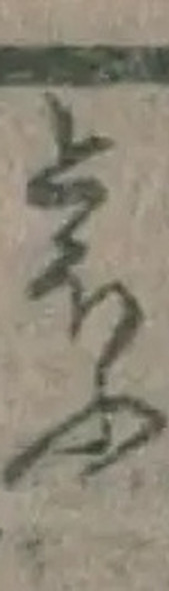とほふ

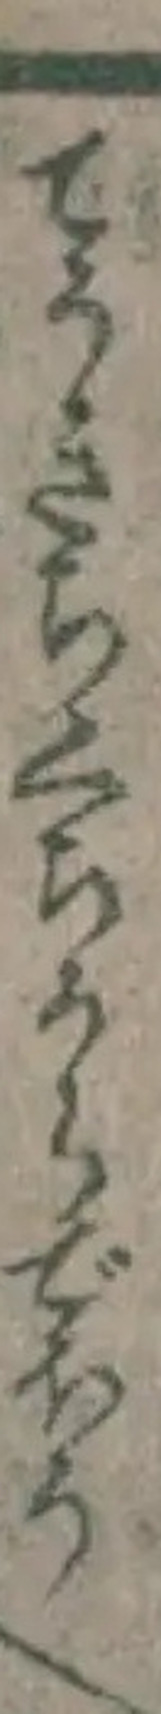てうきちくちからでほう
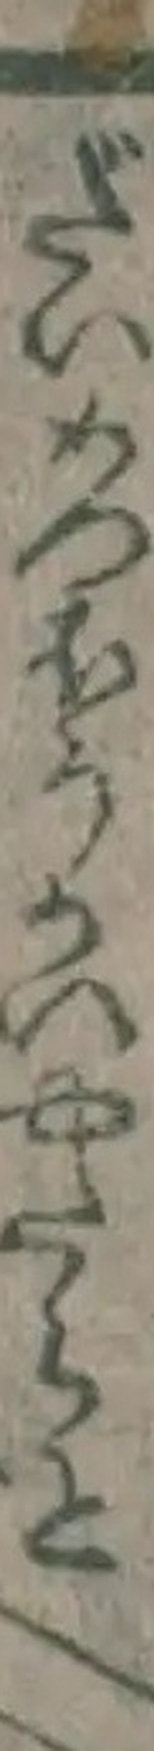だいめつほうかいやたらと
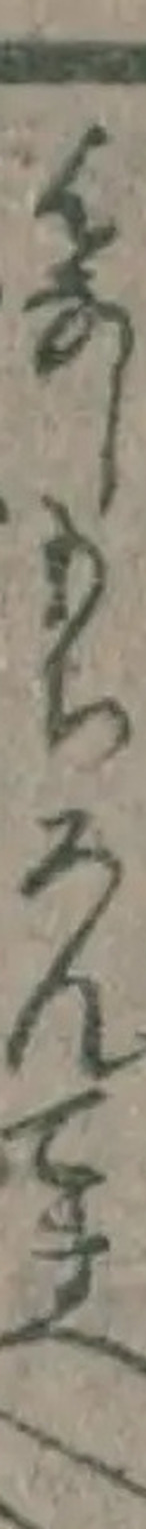はなしもちろんてまへ
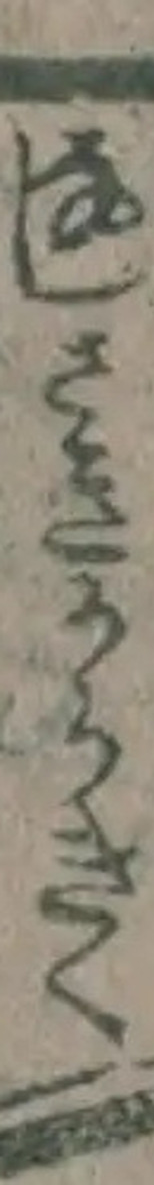なしさきからきく
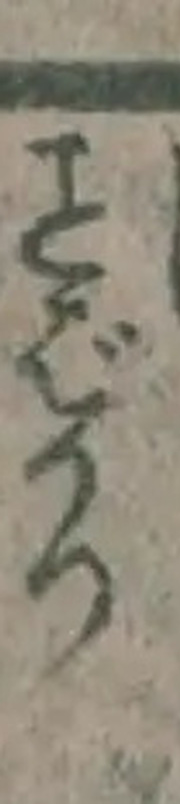ことばかり
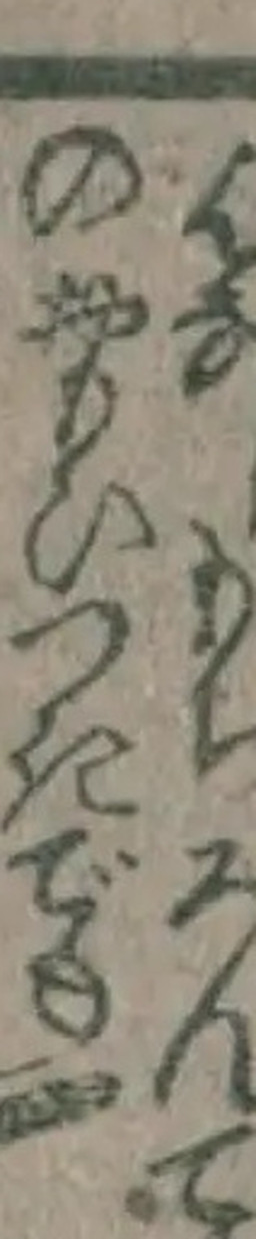のおもひつきでも
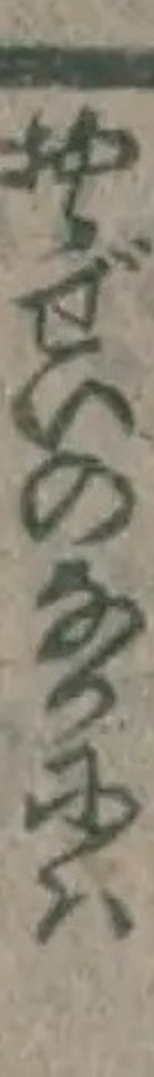おゝぜいのなかには
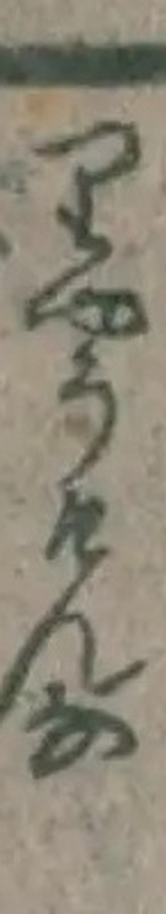りやうけんな
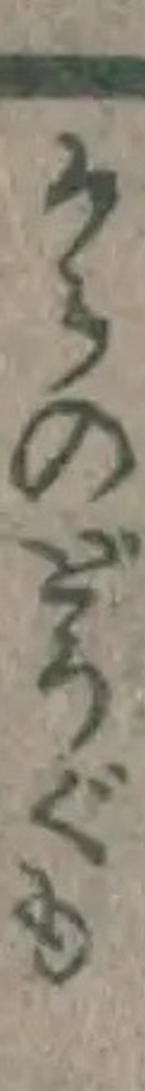からのどうぐも
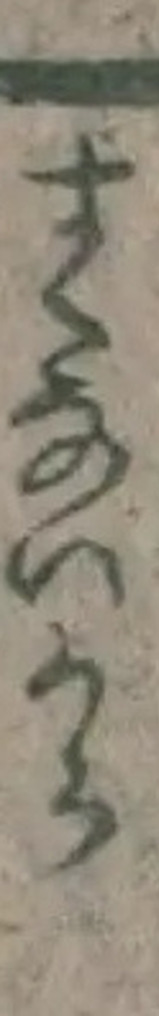すくないから
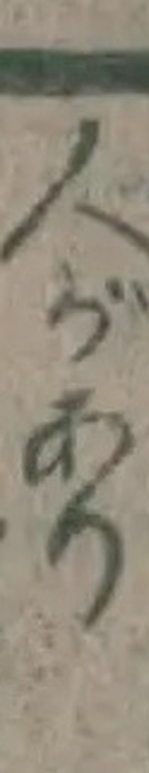人があり
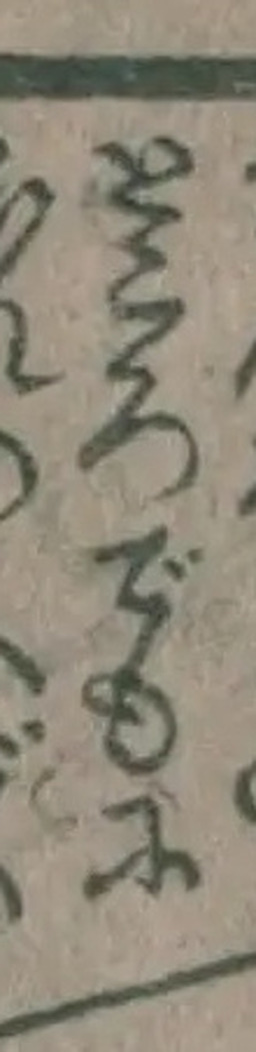ところでもに
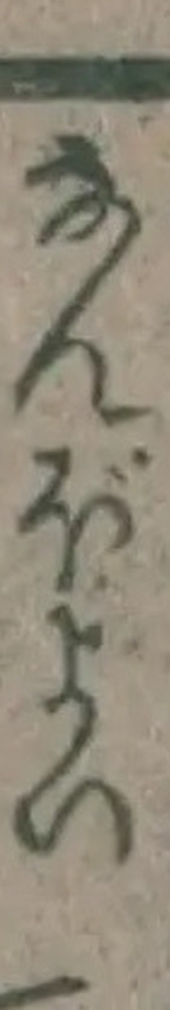なんぼよい
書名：縦筒放唐の噺 3巻
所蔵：国立国会図書館 National Diet Library, JAPAN
